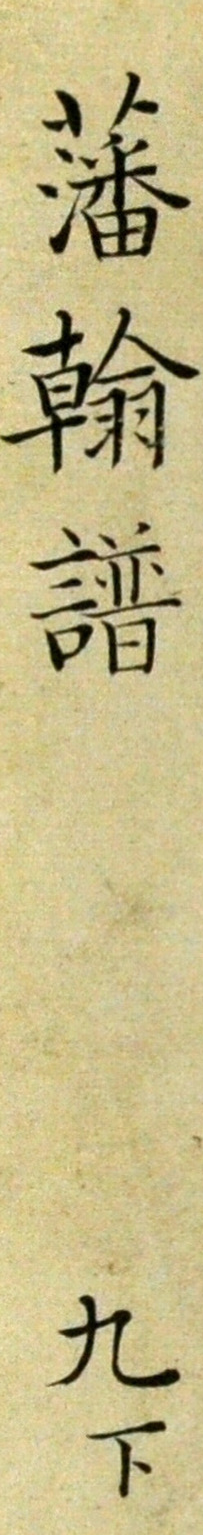藩翰譜九下

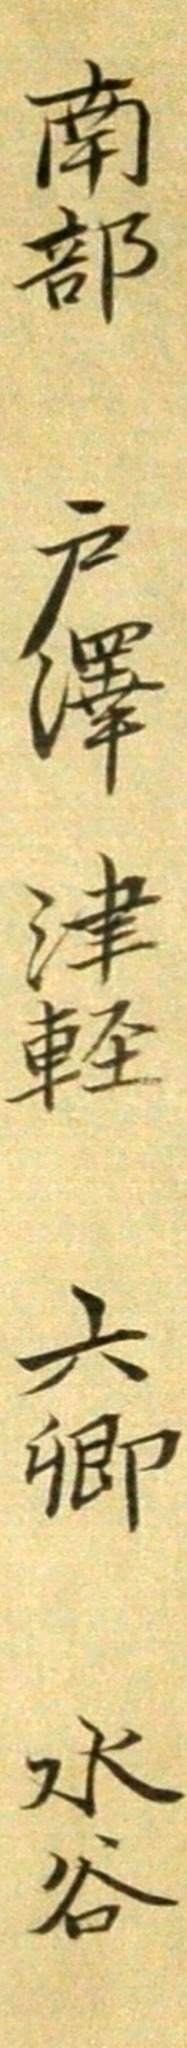南部戸沢津軽六郷水谷
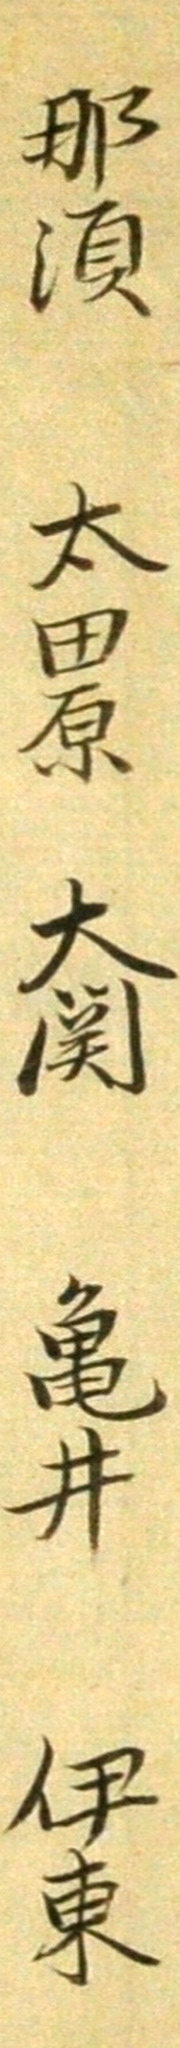那須太田原大関亀井伊東
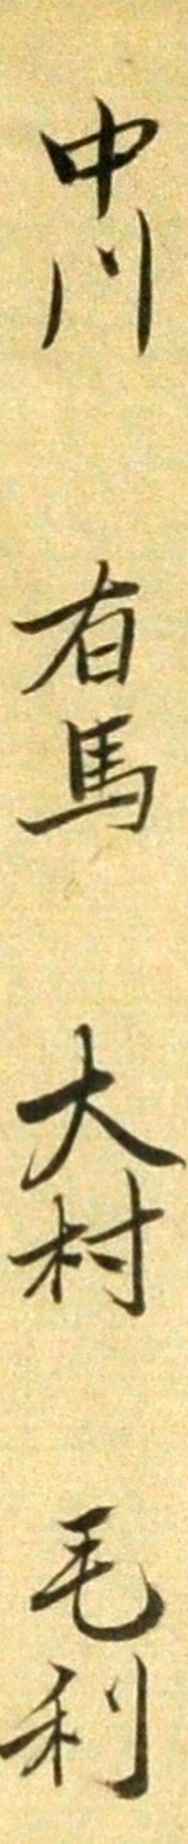中川有馬大村毛利
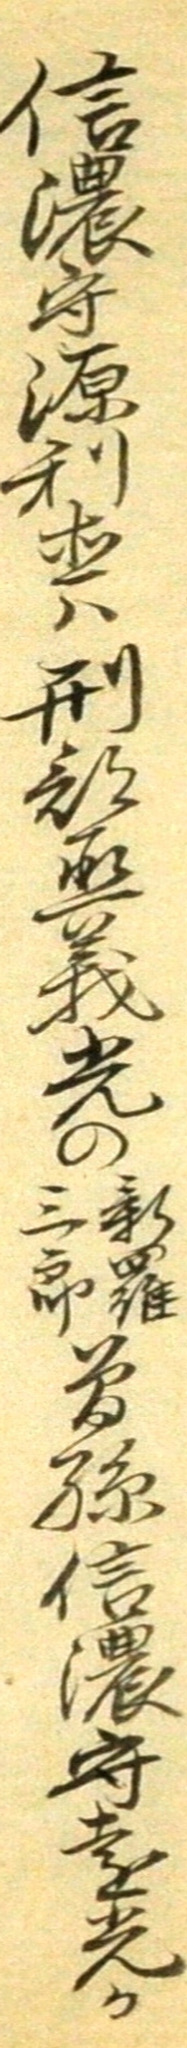信濃守源利直は刑部丞義光の新羅三郎曽孫信濃守遠光か
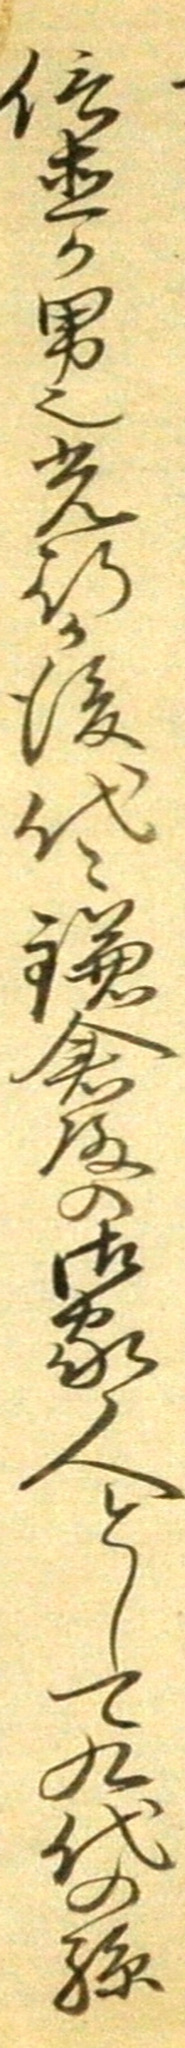信直か男也光行か後代々鎌倉殿の御家人として九代の孫
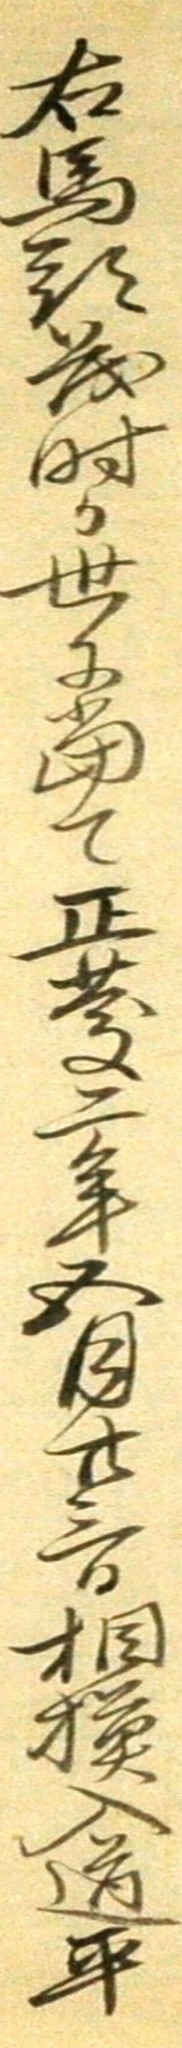右馬頭茂時か世に当て正慶二年五月廿三日相模入道平
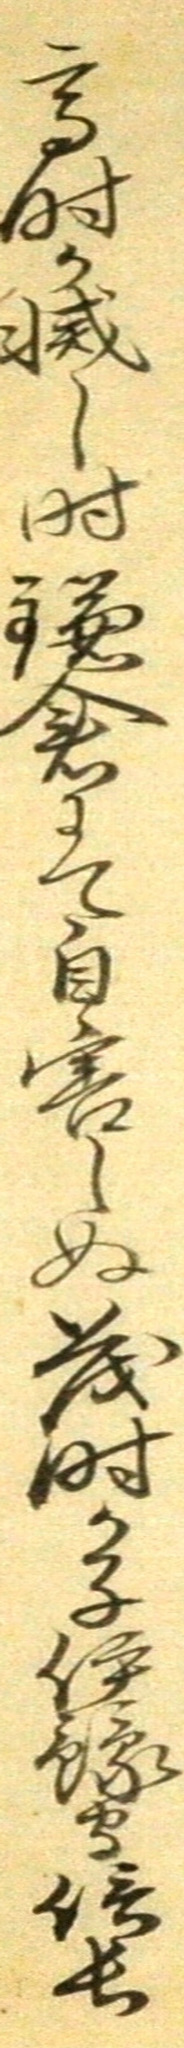高時か滅し時鎌倉にて自害しぬ茂時か子伊予守信長
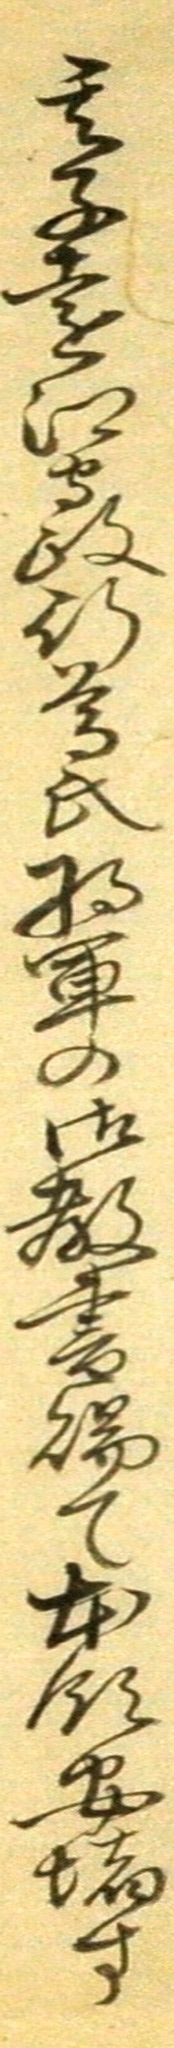其子遠江守政行尊氏将軍の御教書賜て本領安堵す
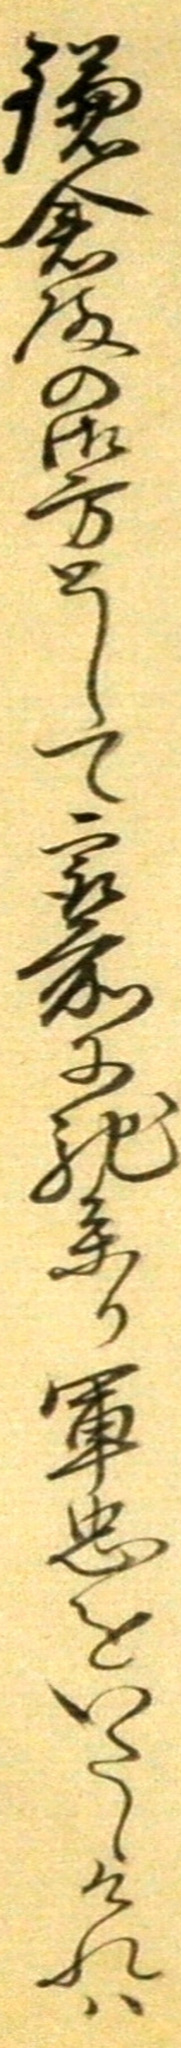鎌倉殿の御方として最前に馳参り軍忠をいたしけれは
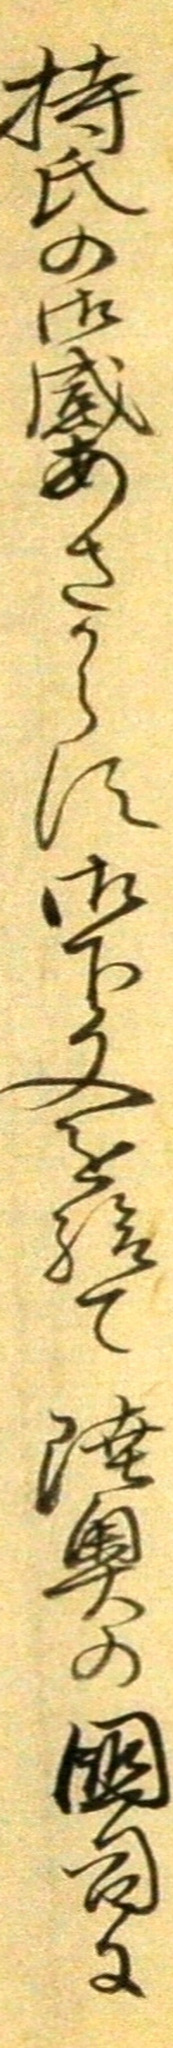持氏の御感あさからす御下文を給て陸奥の国司に

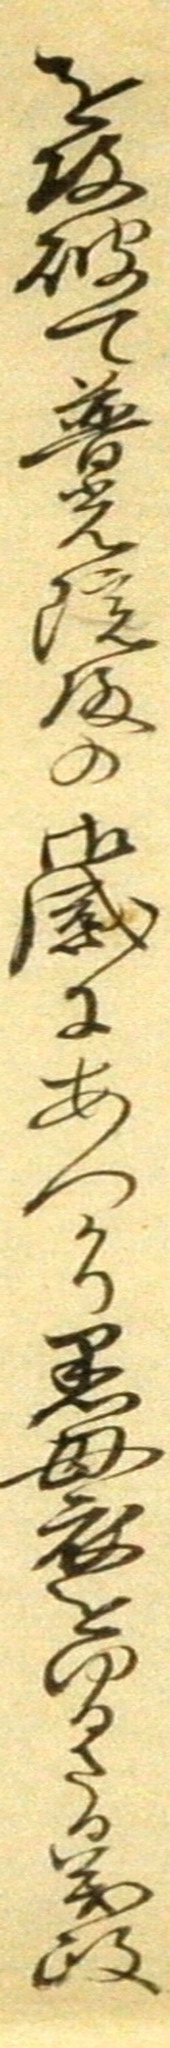を攻破て普光院殿の御感にあつかり黒母衣をゆるさる茂政
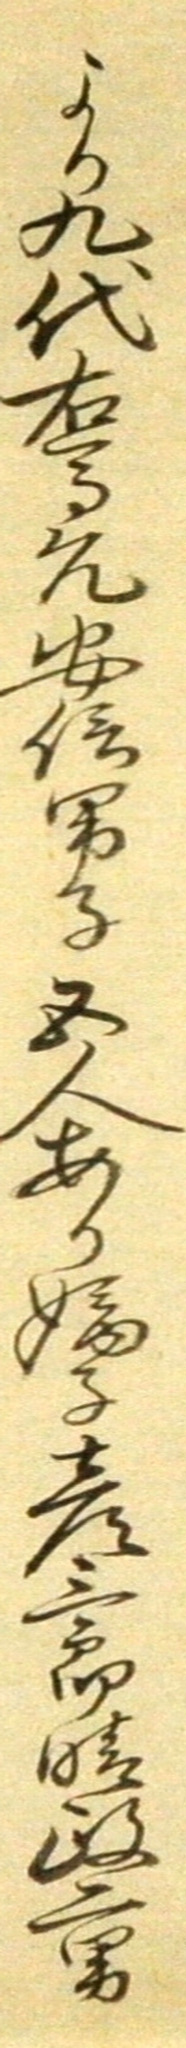より九代右馬允安信男子五人あり嫡子彦三郎晴政二男
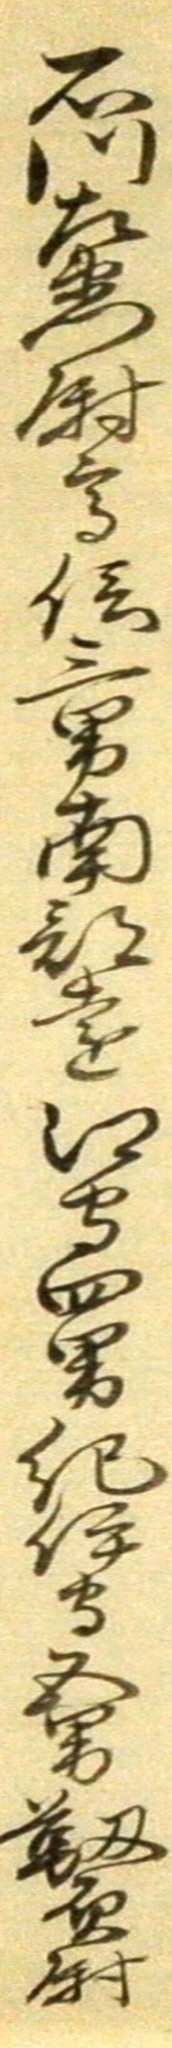石川左衛門尉高信三男南部遠江守四男紀伊守五男靫負尉
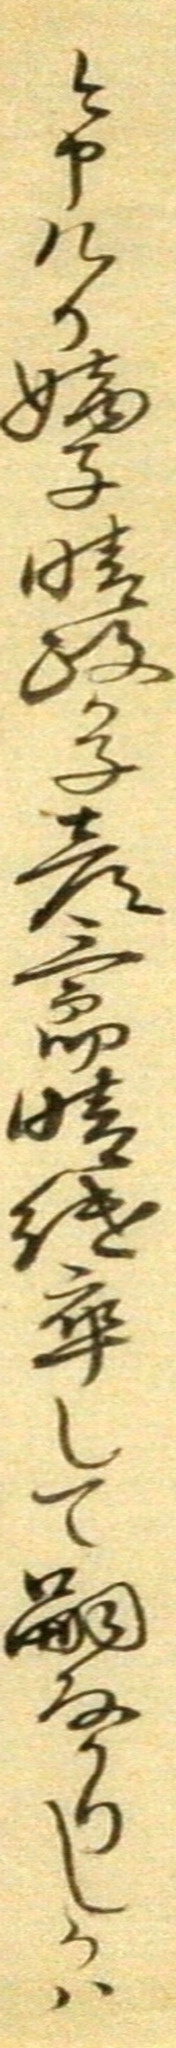と申けり嫡子晴政か子彦三郎晴継卒して嗣なかりしかは
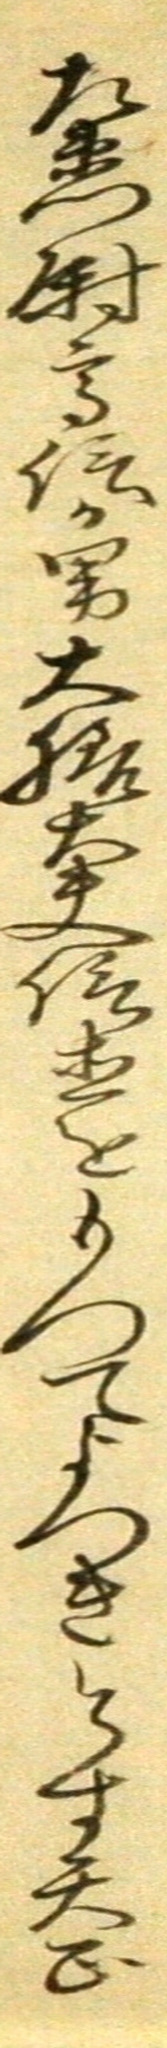左衛門尉高信か男大膳大夫信直をもつてよつきとす天正
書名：藩翰譜（九・下）
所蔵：伊那市立高遠町図書館・合同会社AMANE
